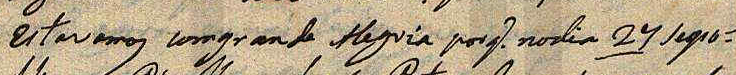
Estavamos com grande Alegria porq̄ no dia 27 se po
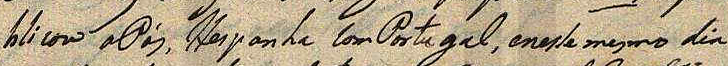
blicou a Pás, Hespanha com Portugal, e neste mesmo dia
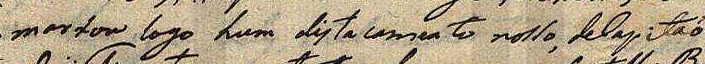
marxou logo hum distacamento nosso de Capitaõ
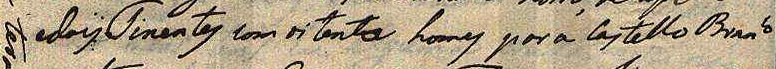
e dois Tinentes com oitenta homes para Castello Branco
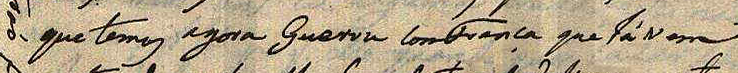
que temos agora Guerra com França que Já vem
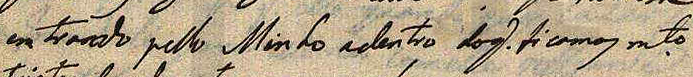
entrando pello Minho adentro do q̄. ficamos m.to
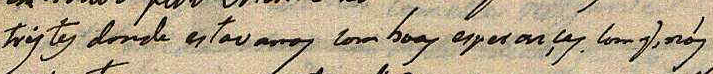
tristes donde estavamos com boas esperanças, com q̄. nós
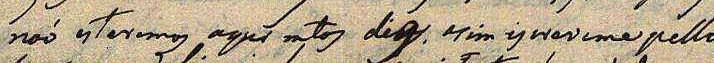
naõ esteremos aqui m.tos dias, asim iscreveme pello
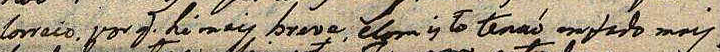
Corraio porq̄. hé mais breve, e Com isto te naõ enfado mais
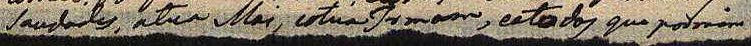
saudades a tua Mai, e a tua Jrmam, e a todos que por mim
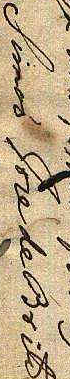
Simaõ Joze de Brito
